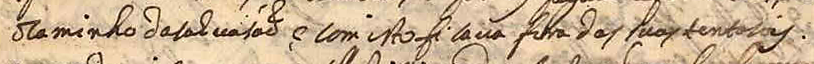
o caminho da saluasaõ, e com isto ficaua fora das suas tentasois.
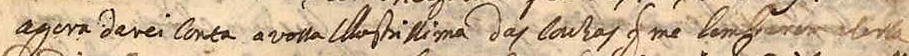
agora darei conta a vossa Illustrissima das couzas q̄ me lembrarem acerca
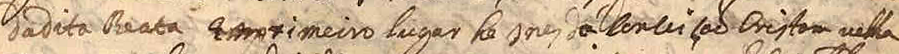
da dita Beata Em primeiro Lugar he Jnes da Conceiçaõ Cristam uelha
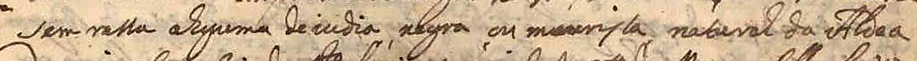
sem rassa alguma de iudia, negra, ou mourisca, natural da Aldea
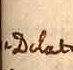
a Delat
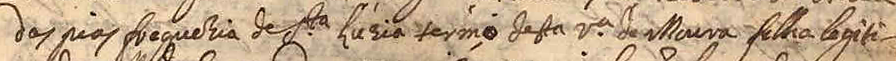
das pias freguezia de S.ta Luzia termo desta v.a de Moura filha legiti
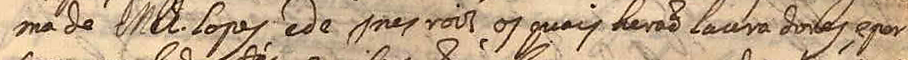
mado Mel Lopes, e de Jnes roiz̄ os quais heraõ lauradores, e por
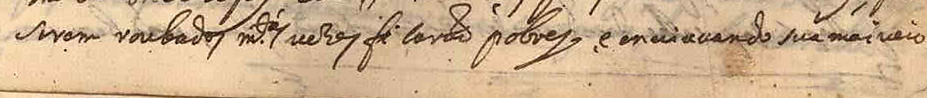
serem roubados m.tas uezes ficarão pobres, e enuiuuando sua mai ueio
